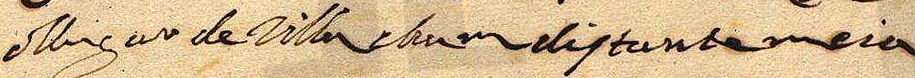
o llugar de Villa cham distante meia
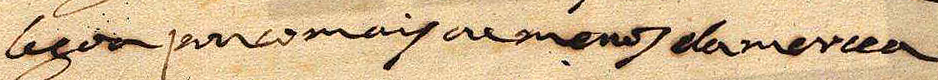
legoa pouco mais ou menos da mercea
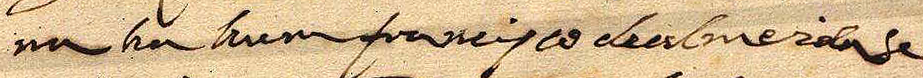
na ha hum francisco de almeida se
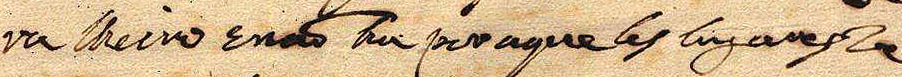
ralheiro E naõ ha por aqueles lugares Ve
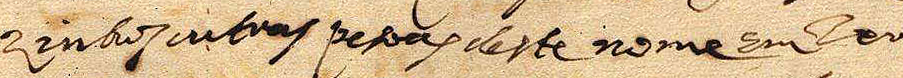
zinhos outras pesoas deste nome em Ver
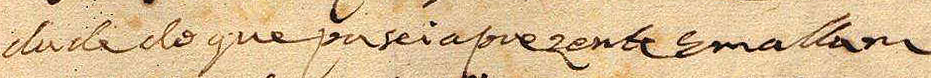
dade do que pasei a prezente Em allam
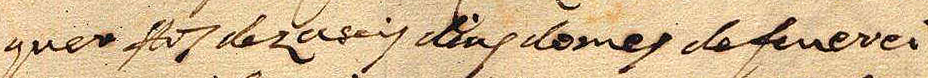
quer Aos dezaseis dias do mes de feuerei
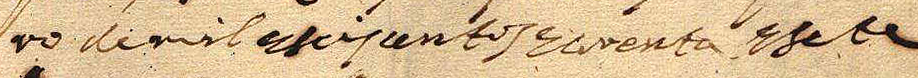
ro de mil E seiscentos E corenta E sete
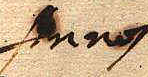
Annos
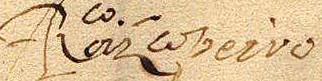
fco Roiz copeiro
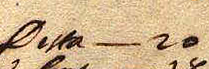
Desta – 20
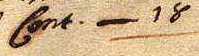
Cont. – 18
